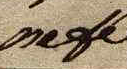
na fé
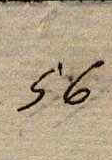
56
